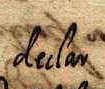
declar
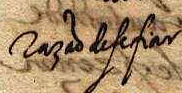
razaõ de se fiar
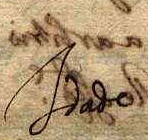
Jdade
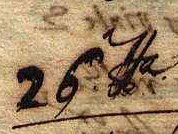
26a tta.
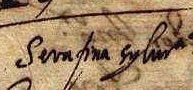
Serafina sylura.
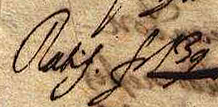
Ratif. fol 39
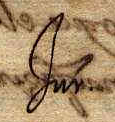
Jur.
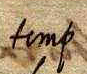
temp
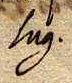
lug.
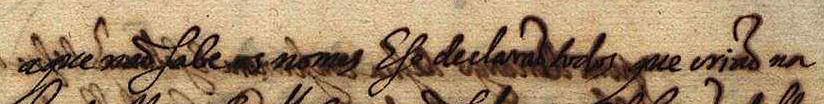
a que naõ sabe os nomes E se declaraõ todos que criaõ na
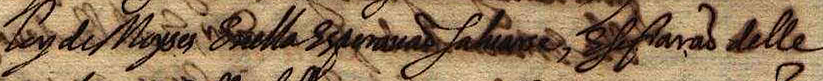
ley de Moyses E nella Esperauaõ saluarse, E se fiaraõ delle
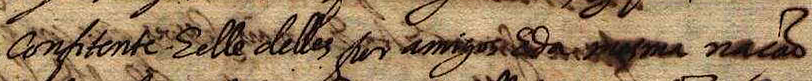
confitente E elle delles por amigos E da mesma naçaõ
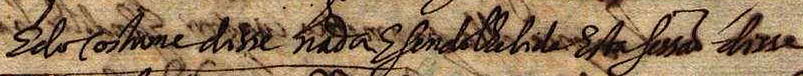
E do costume disse nada E sendolhe lida Esta sessaõ disse
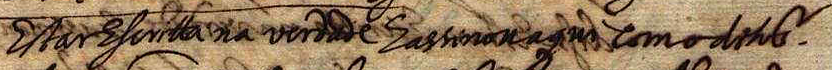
Estar Escritta na verdade E assinou aqui com o dito sr.
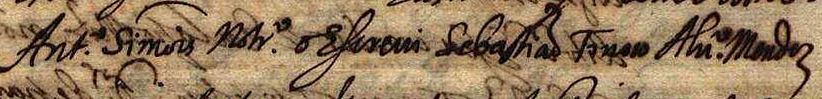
Ant.o Simoĩs Notr.o o Escreui Sebastiaõ Tinoso Alu.o Mendez
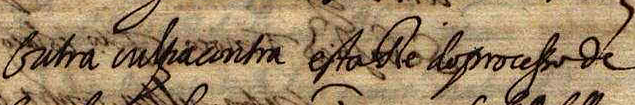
Outra culpa contra esta Re do processo de
